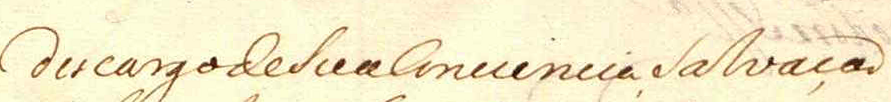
descargo de sua Conciencia, salvaçaõ
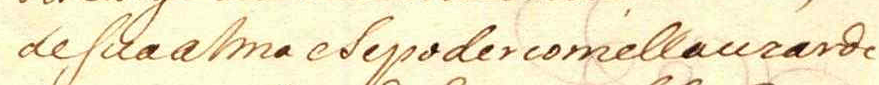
de sua alma e se poder com ella uzar de
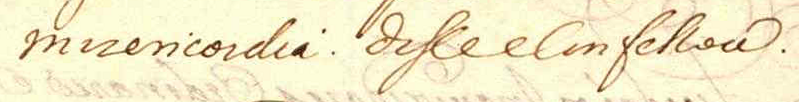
mizericordia: disse e Confessou.
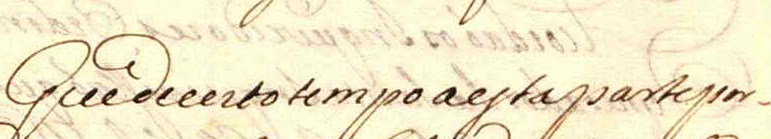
Que de certo tempo a esta parte per
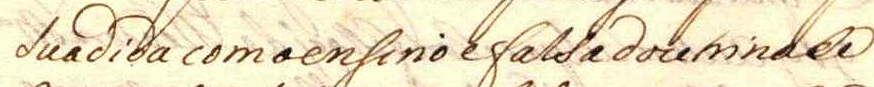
suadida com o ensino e falsa doutrina de
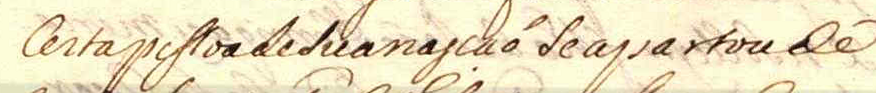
certa pessoa de sua nasçaõ se apartou de
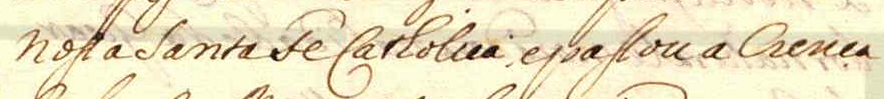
nossa Santa Fe Catholica, e passou a Crença
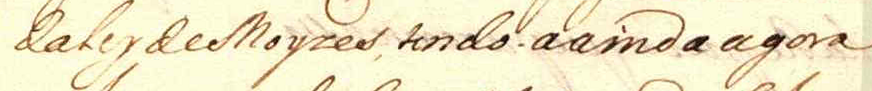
da Ley de Moyzes, tendo-a ainda agora
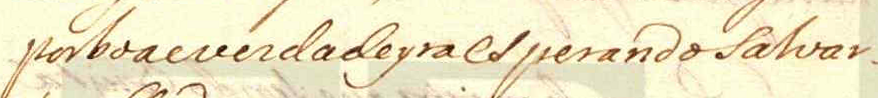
por boa e verdadeyra esperando salvar
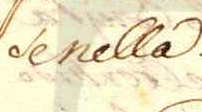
se nella
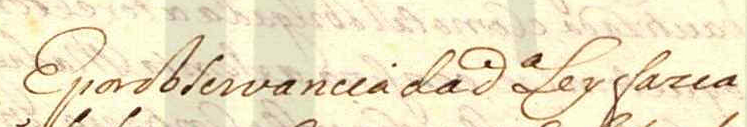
E por observancia da d.a Ley fazia
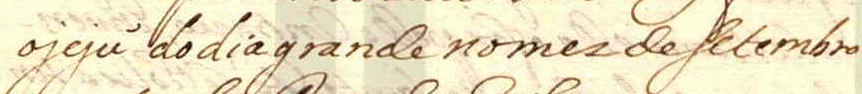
o jejū do dia grande no mez de setembro
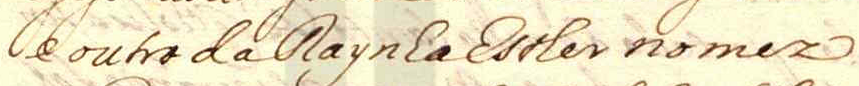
e outro da Raynha Esther no mez
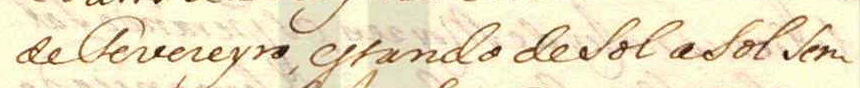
de Fevereyro, estando de sol a sol sem
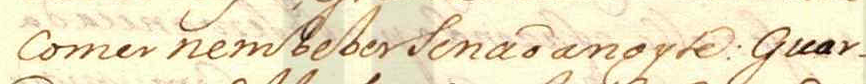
comer, nem beber senaõ a noyte: Guar
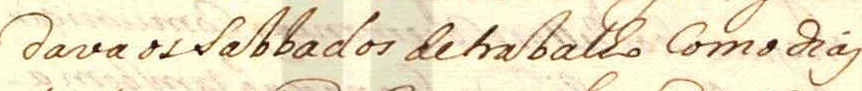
dava os Sabbados de trabalho Como dias
